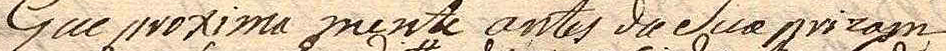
Que proximamente antes da sua prizam,
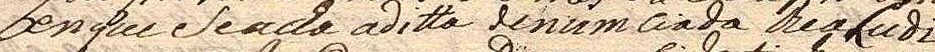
en que se acha a ditta denumciada Re aLudi
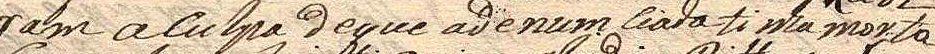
ram a culpa de que a denumciada tinha morto
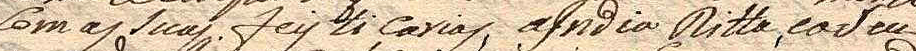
com as suas feytiçarias, a Jndia Ritta, e o Seu
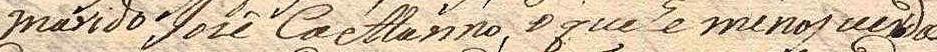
marido Jozé Caettanno, o que he menos verda
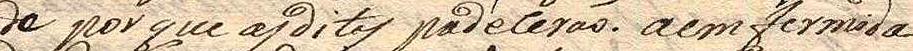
de porque as ditas padeceraõ. a emfermida
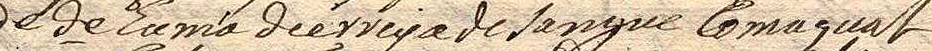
de de huma dierreya de sangue com a qual
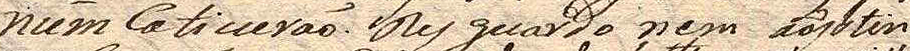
numca tiueraõ. Resguardo nem a osbtin
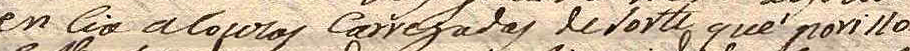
encia a couzas carregados de sorte que por isso
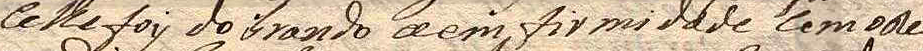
ce lhe foy dobrando a emfirmidade como Re
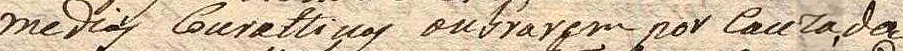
medios courattiuos oubrarem por cauza, da
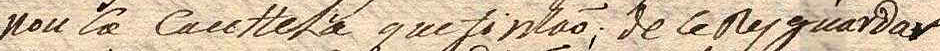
pouCa cautteLa que tinhaõ, de Ce Resguardar
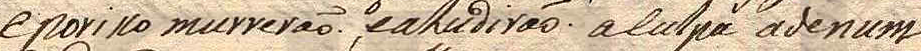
e por isso murreraõ, e aLudiraõ a culpa a denum
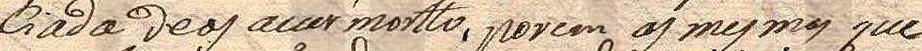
ciada de os auer mortto, porem as mesmas que
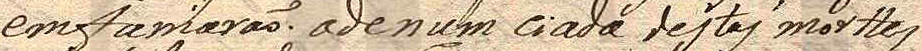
emfamaraõ. a denumciada destas morttes
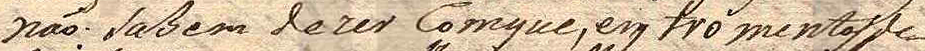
não sabem dezer com que, enstromentos de
